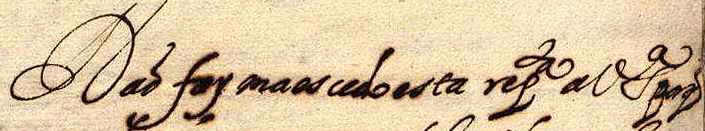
Naõ foy maes cedo esta rep.ta a V Sa porq̄
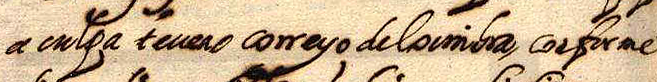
a culpa teuea o correyo de Coimbra, conforme
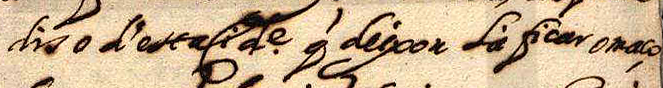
dis o d'esta Cid.e q̄ deixou lá ficar o maço
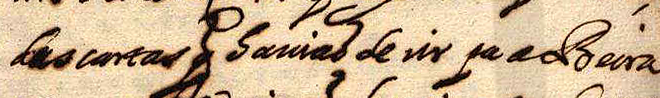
das cartas q̄ hauiaõ de vir pa a Beira
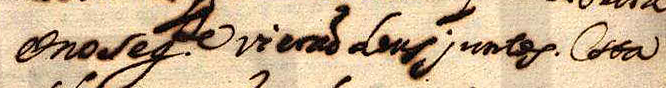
e no seg.te vieraõ dous juntos. Esta
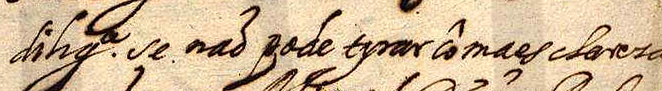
dilig.a se naõ pode tyrar cō maes clareza
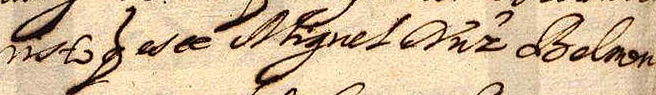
visto q̄ este Miguel Nuz̄ Belmon
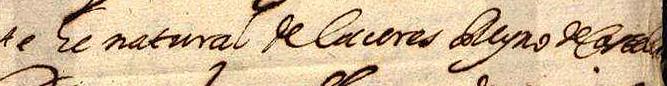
te he natural de Caceres Reyno de Castela
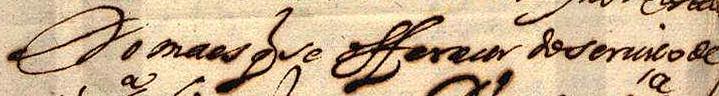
No mais q̄ se offerecer do seruiço de
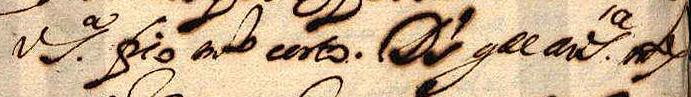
V S.a fico mto certo. Ds̄ gde a v S.a mtos
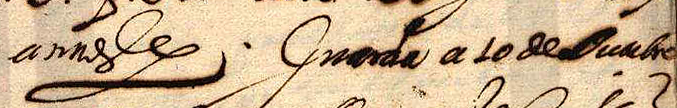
annos. Guarda a 10 de Outubro
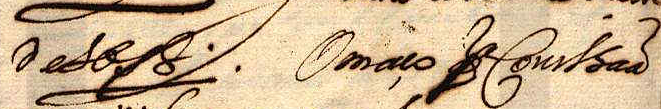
de 1658. O maço pa Couilhaā
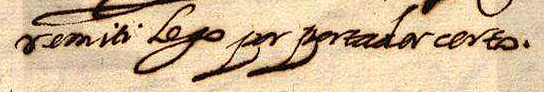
remiti logo por portador certo.
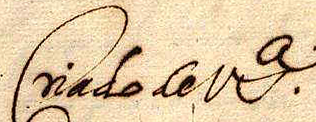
Criado de V S.a
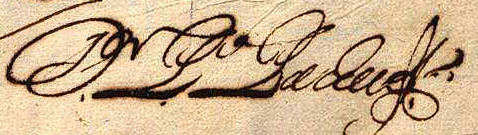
D.or P.o Pacheco
